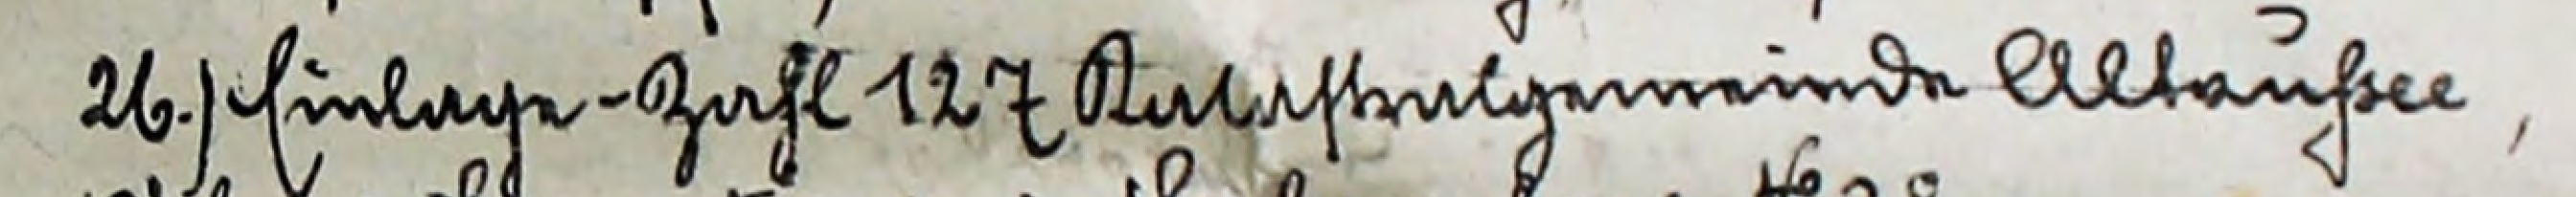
26.) Einlage - Zahl 127 Katastralgemeinde Altaussee,
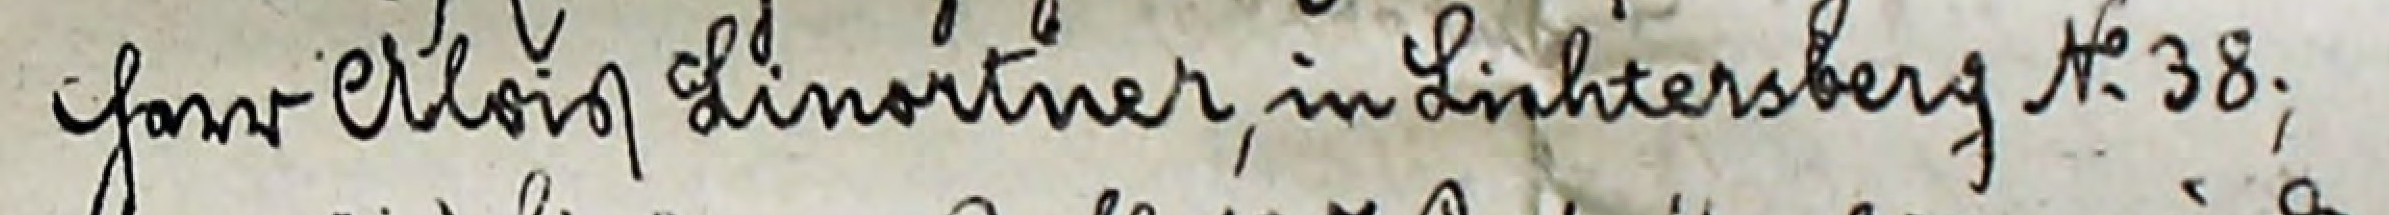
Herr Alois Linortner, in Lichtersberg No 38;
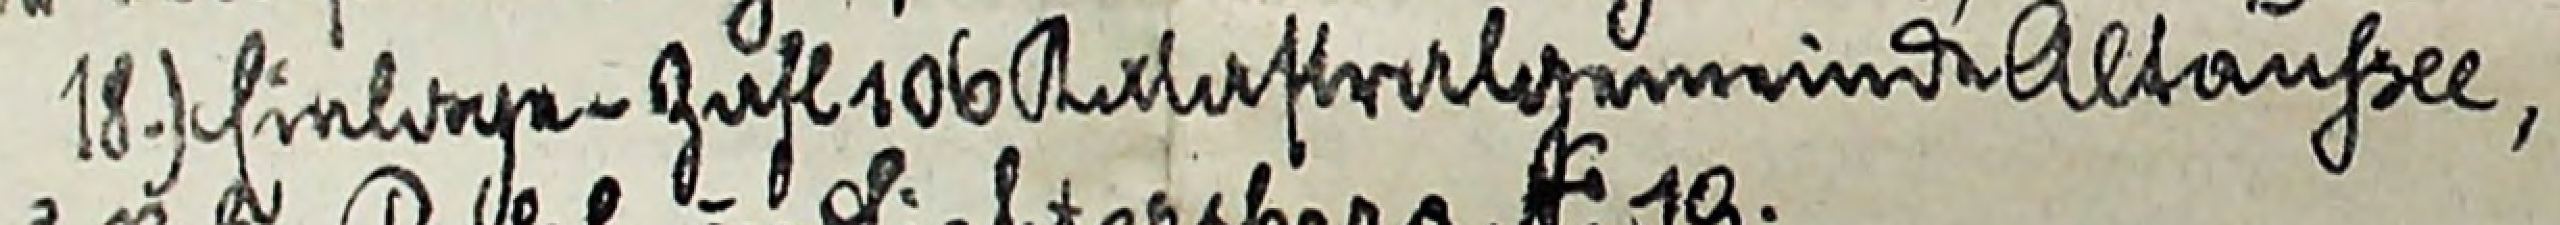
18.) Einlage - Zahl 106 Katastralgemeinde Altaussee,
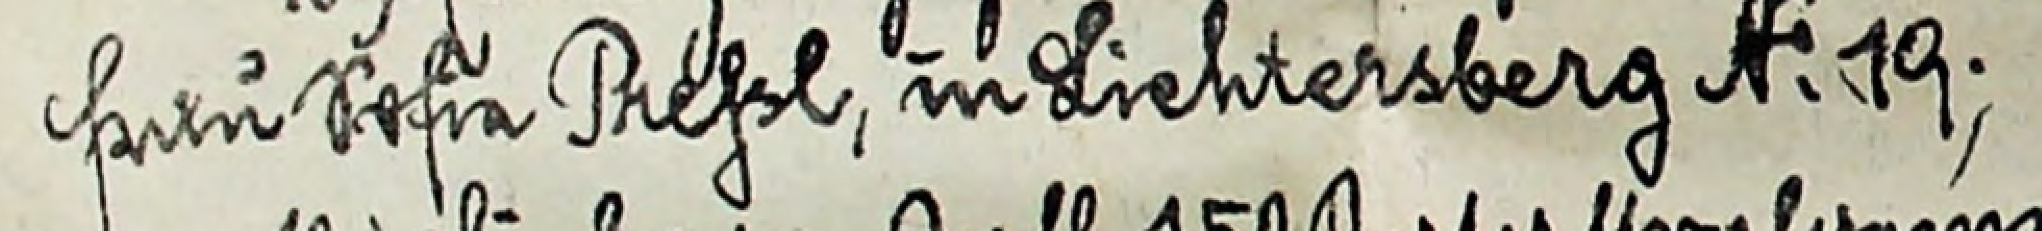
Frau Sofia Pressl, in Lichtersberg No 19;
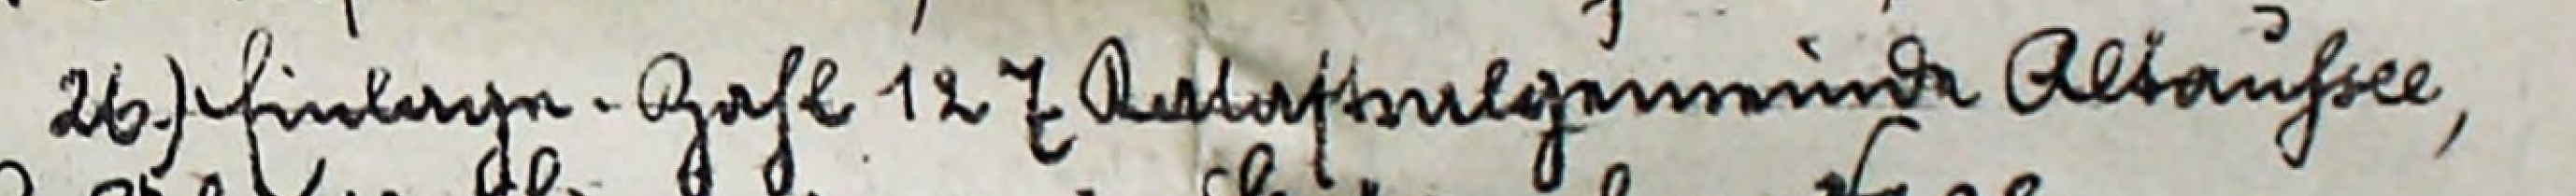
26.) Einlage - Zahl 127 Katastralgemeinde Altaussee,
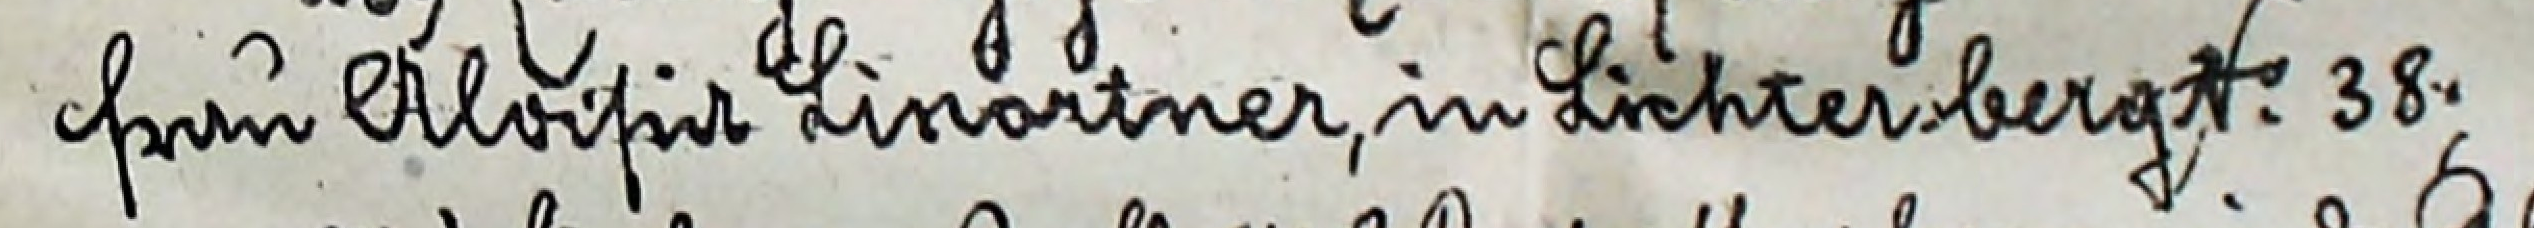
Frau Aloisia Linortner, in Lichtersberg No 38;
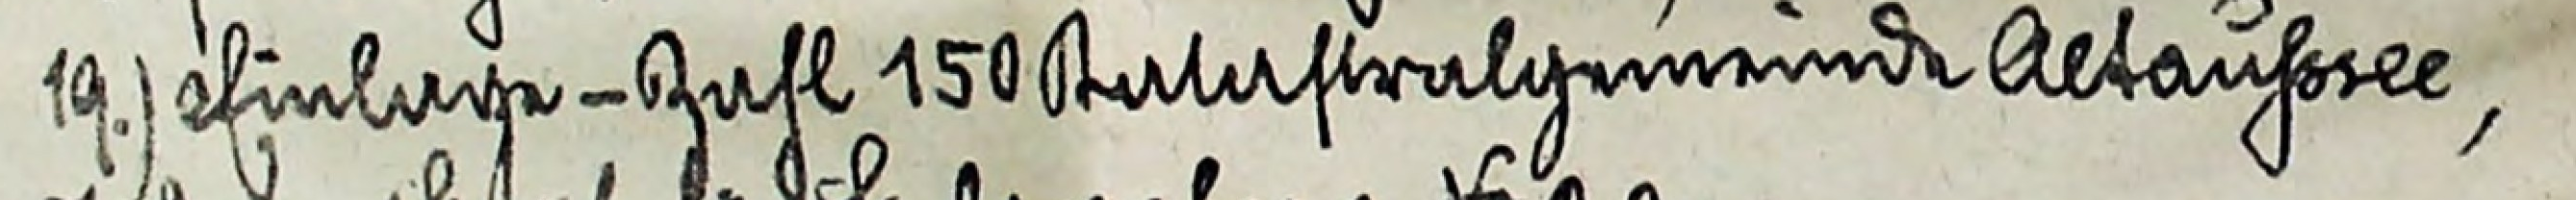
19.) Einlage - Zahl 150 Katastralgemeinde Altaussee,
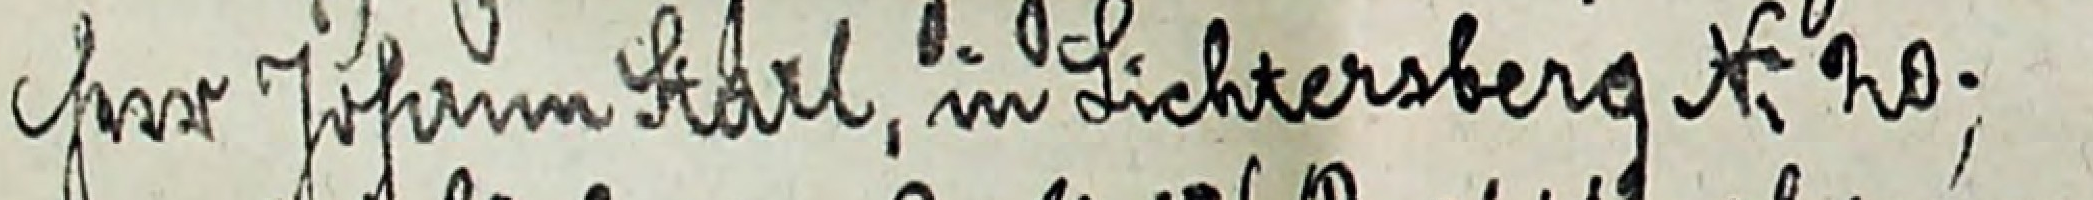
Herr Johann Starl, in Lichtersberg No 20;
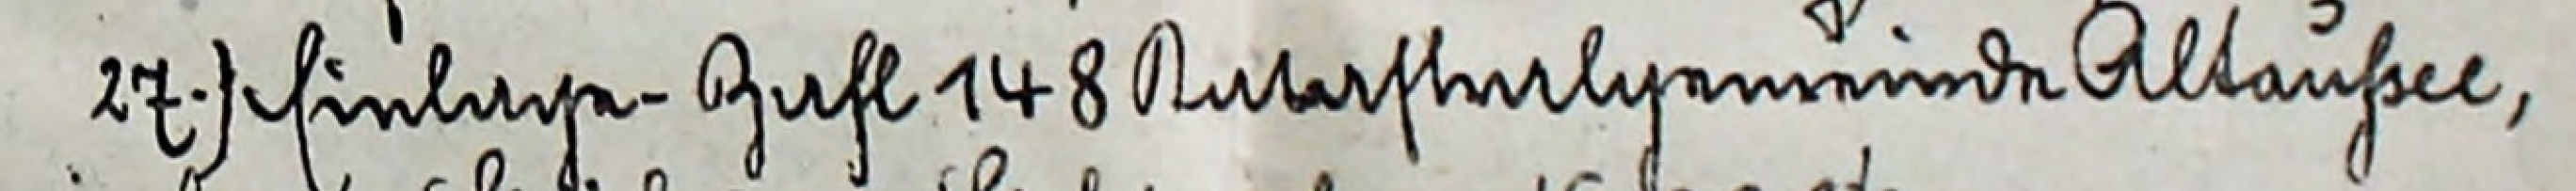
27.) Einlage - Zahl 148 Katastralgemeinde Altaussee,
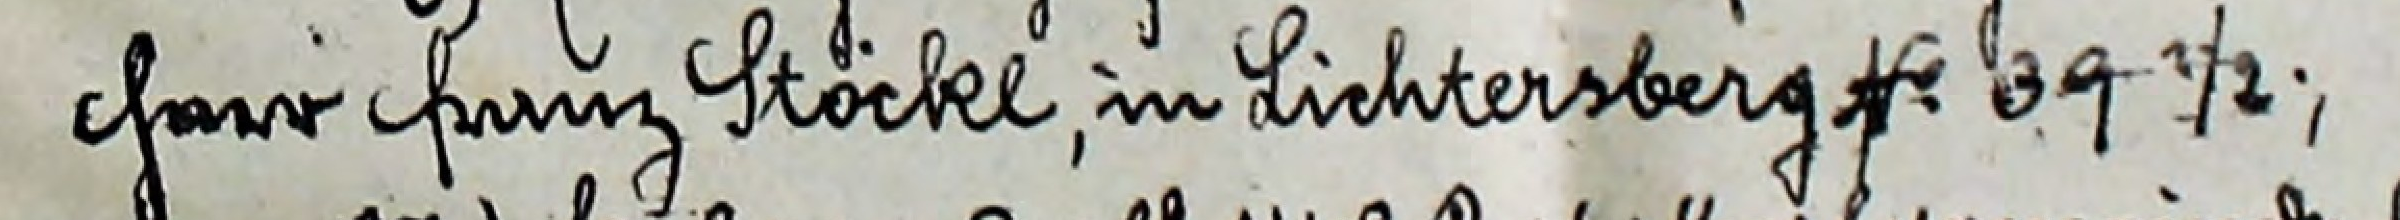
Herr Franz Stöckl, in Lichtersberg No 39 1/2;
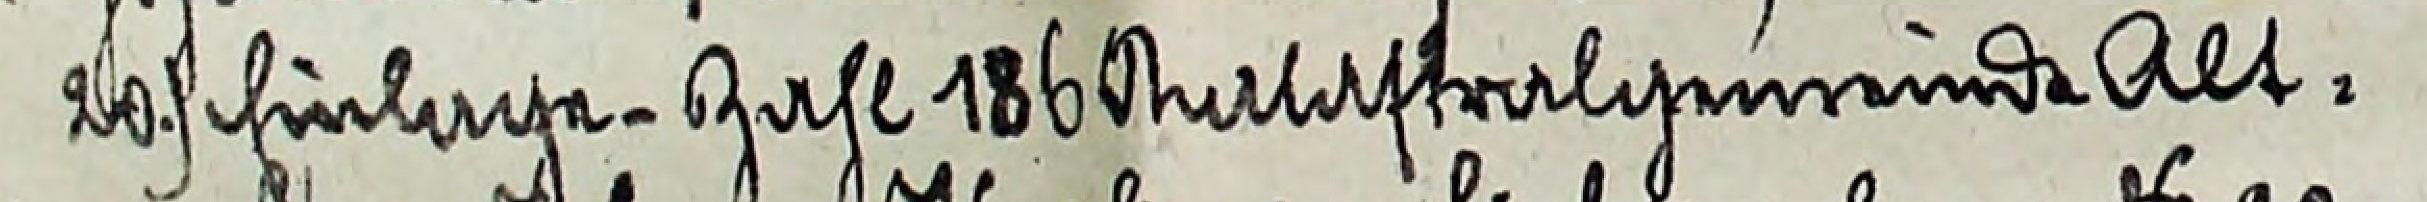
20.) Einlage - Zahl 186 Katastralgemeinde Alt=
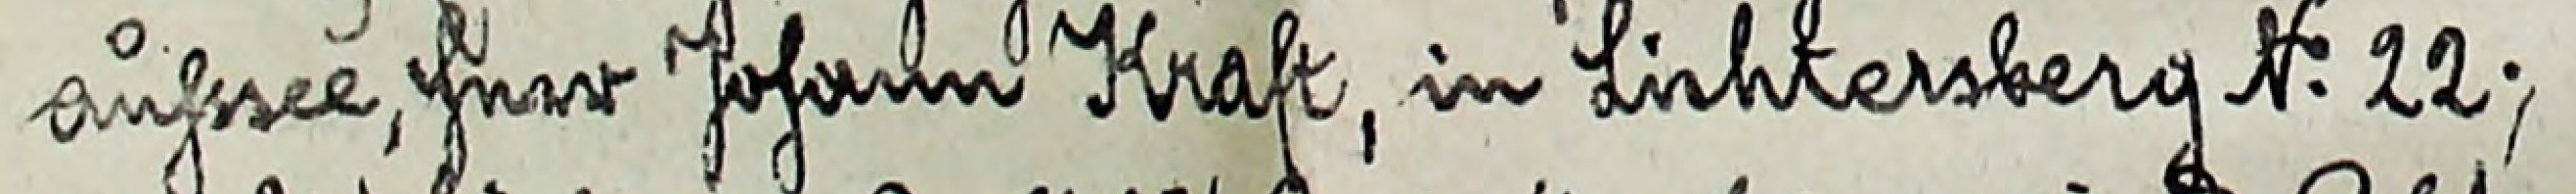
aussee, Herr Johann Kraft, in Lichtersberg No 22;
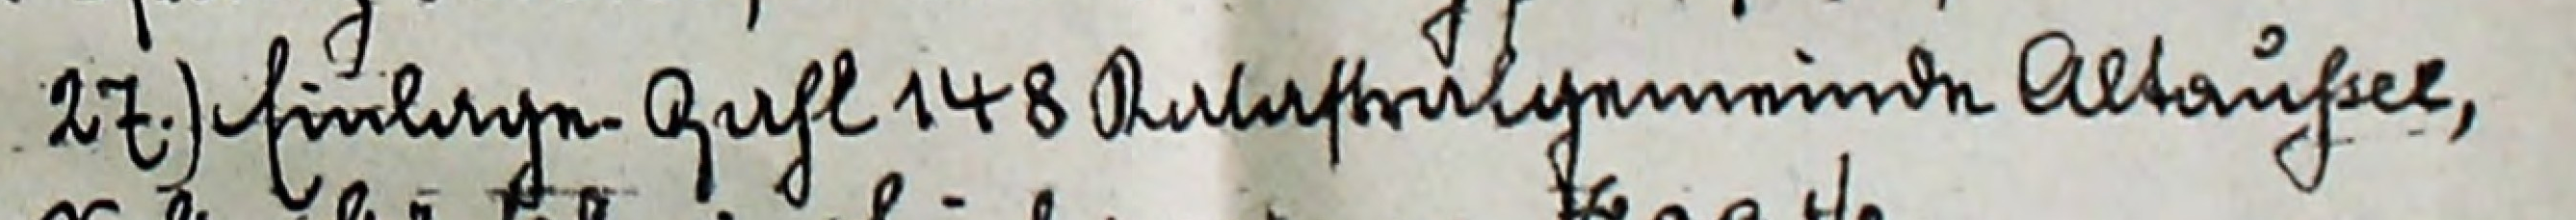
27.) Einlage - Zahl 148 Katastralgemeinde Altaussee,
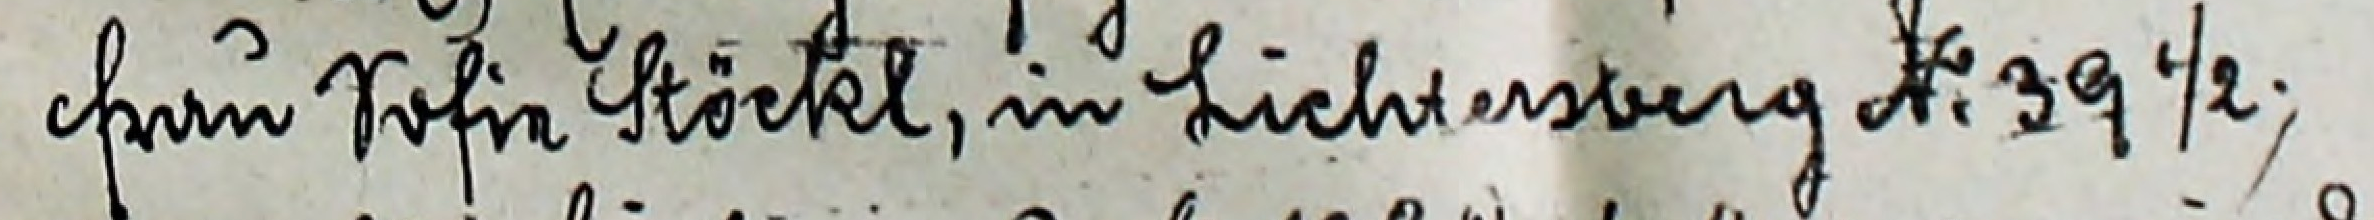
Frau Sofie Stöckl, in Lichtersberg No 39 1/2;
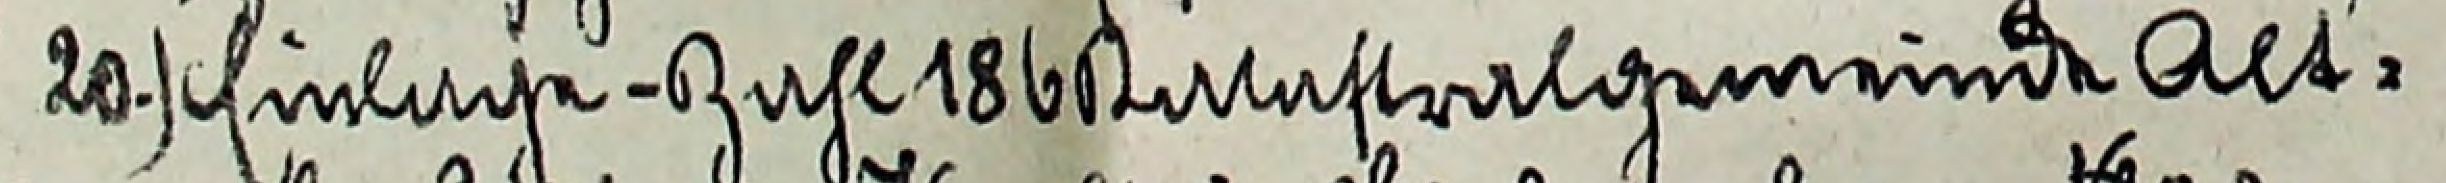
20.) Einlage - Zahl 186 Katastralgemeinde Alt=
